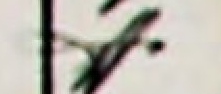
ffer
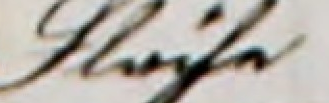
Fläche
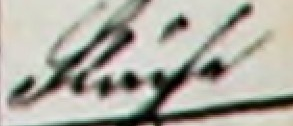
Fläche
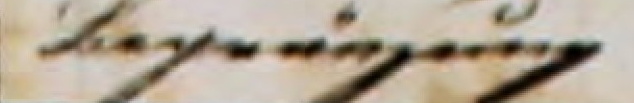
Begränzung
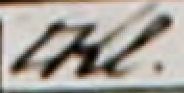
Kl.
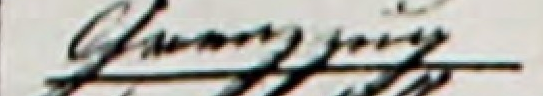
Grenzzug
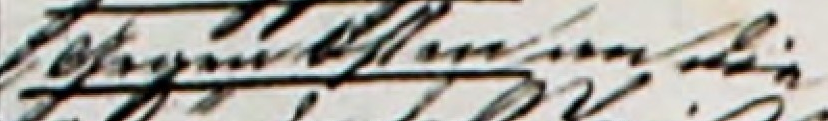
Gegen bissen an die
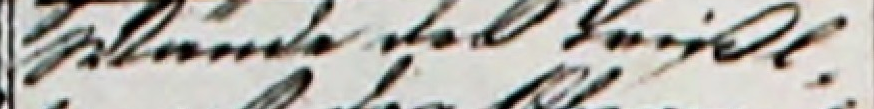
Wände des Trißl„
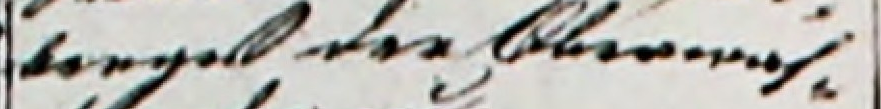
berges der Oberwas„
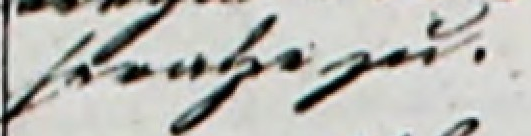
seratze zu.
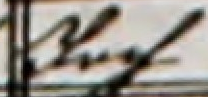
Joch
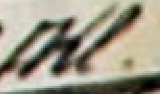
Kl
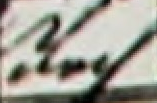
Joch
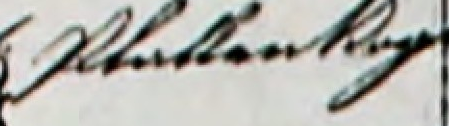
Plattenkogl
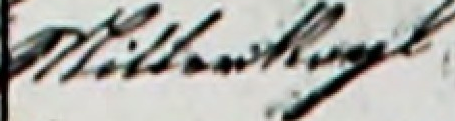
Mitterkogl
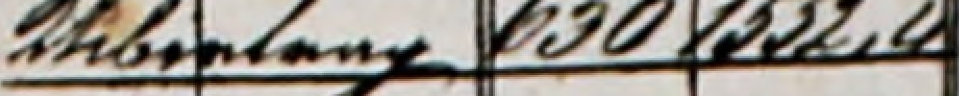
Uebertrag 636 1552,4
